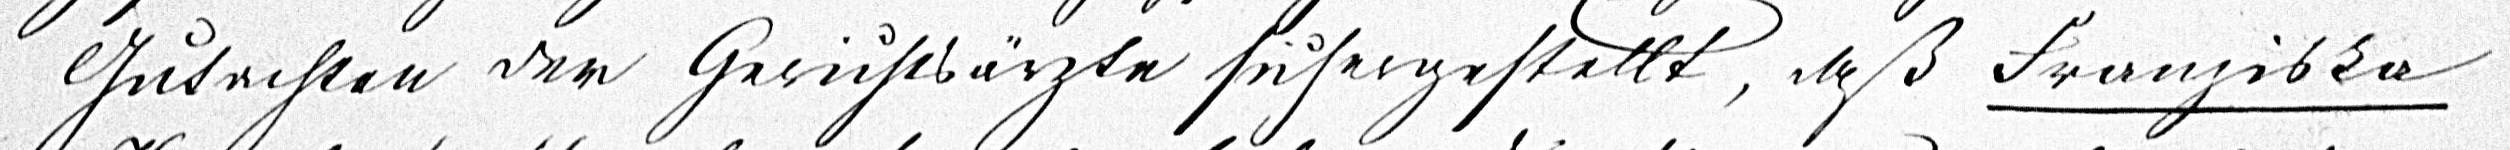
Gutachten der Gerichtsärzte sichergestellt, daß Franziska
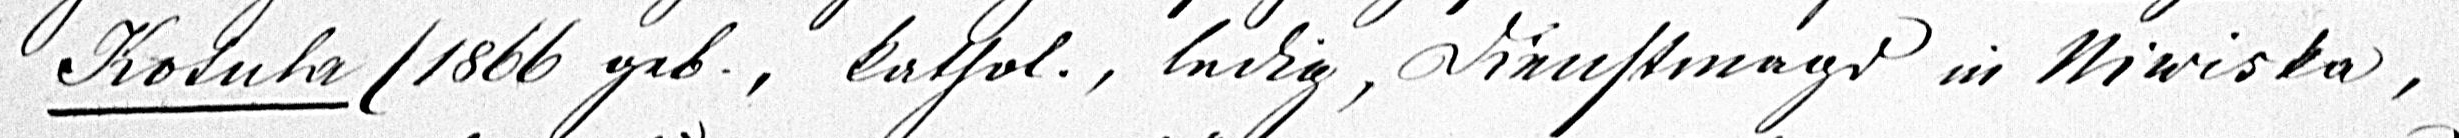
Kotula (1866 geb., kathol., ledig, Dienstmagd in Niwiska,
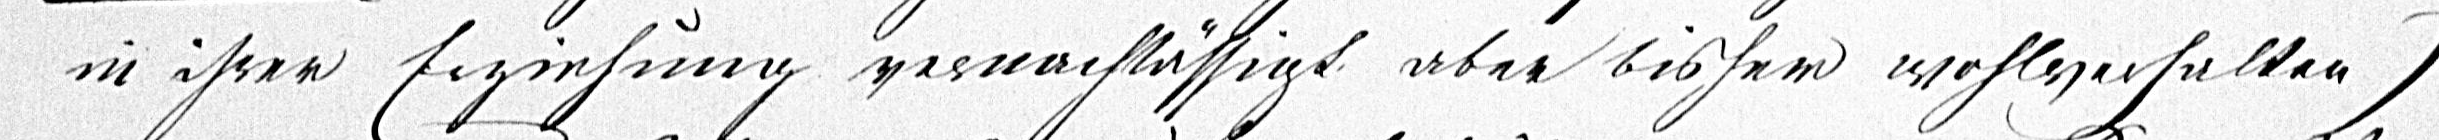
in ihrer Erziehung vernachlässigt aber bisher wohlverhalten)
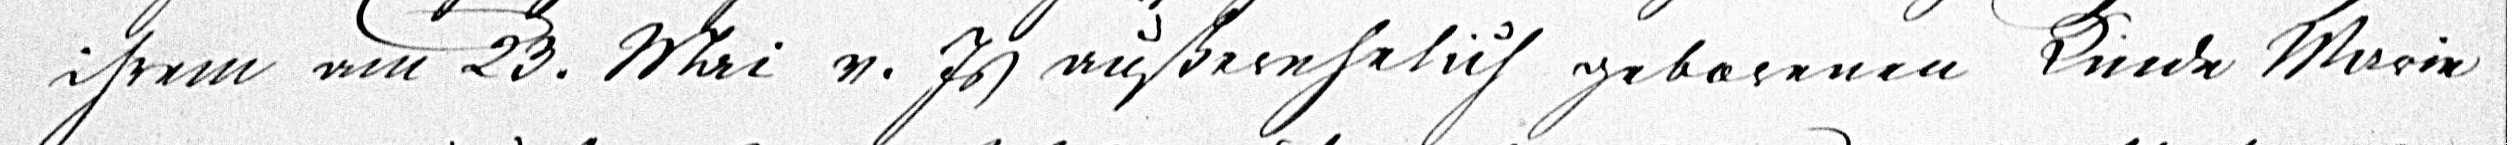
ihrem am 23. Mai v. Js außerehelich geborenen Kinde Marie
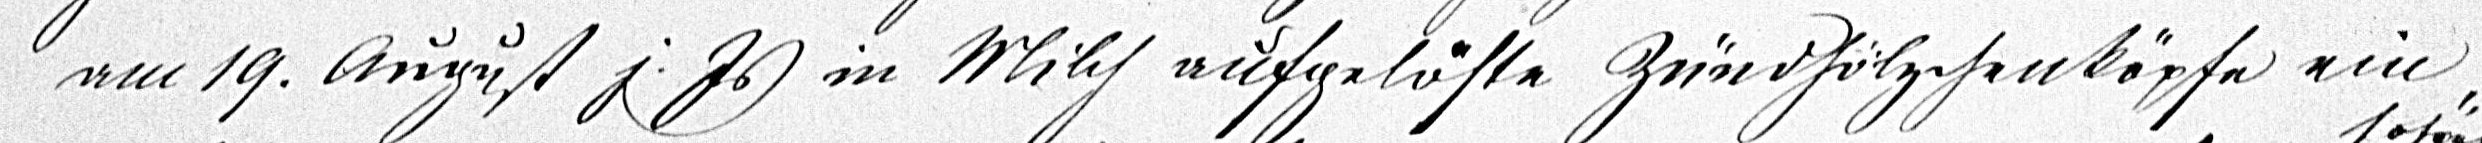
am 19. August v. Js in Milch aufgelöste Zündhölzchenköpfe ein
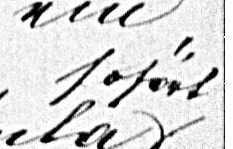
sofo
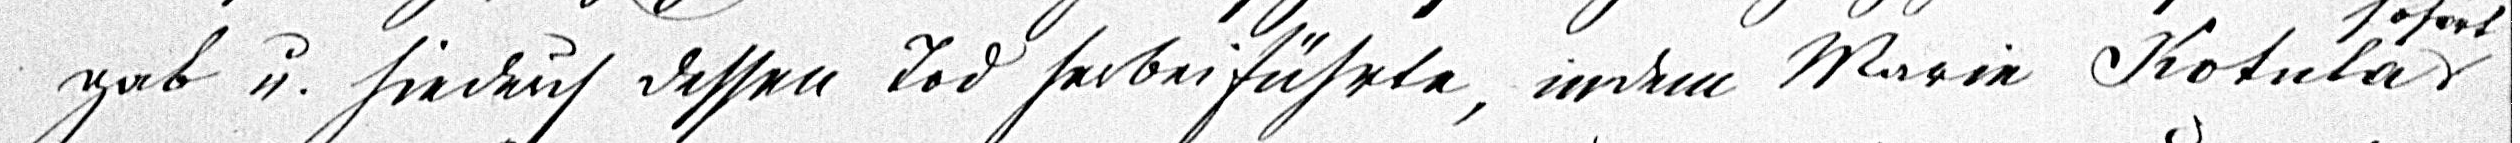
gab u. hiedurch dessen Tod herbeiführte, indem Marie Kotula
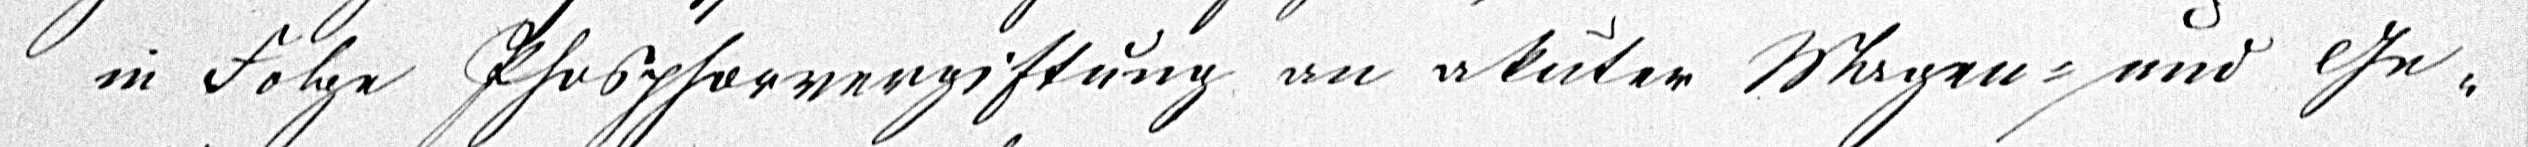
in Folge Phosphorvergiftung an akuter Magen- und Ge¬
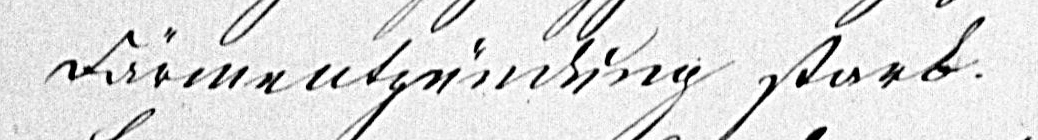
därmentzündung starb.
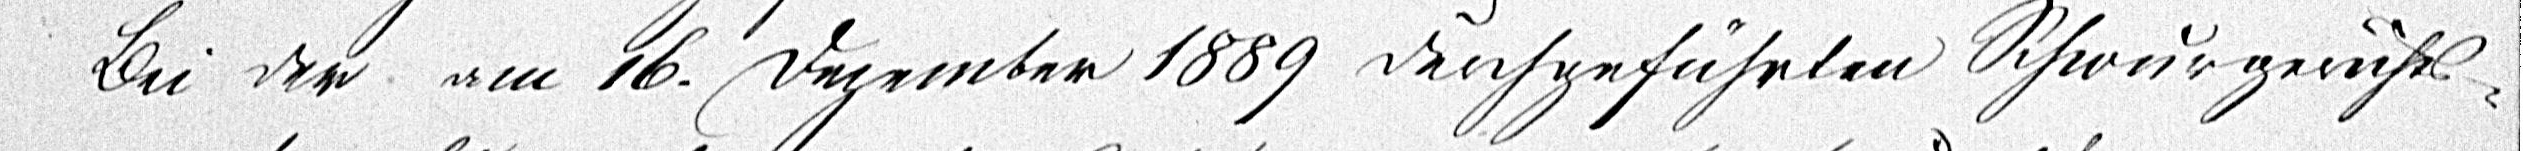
Bei der am 16. Dezember 1889 durchgeführten Schwurgerichts¬
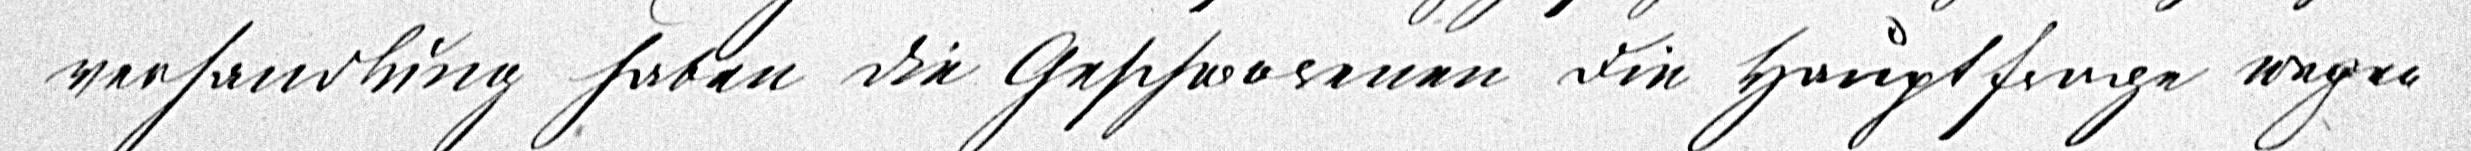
verhandlung haben die Geschworenen die Hauptfrage wegen
